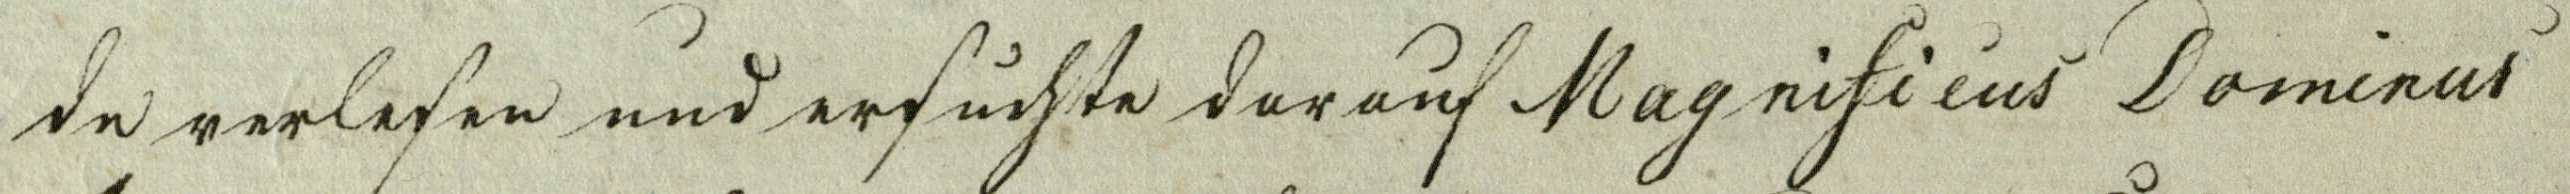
de verlesen und ersuchte darauf Magnificus Dominus
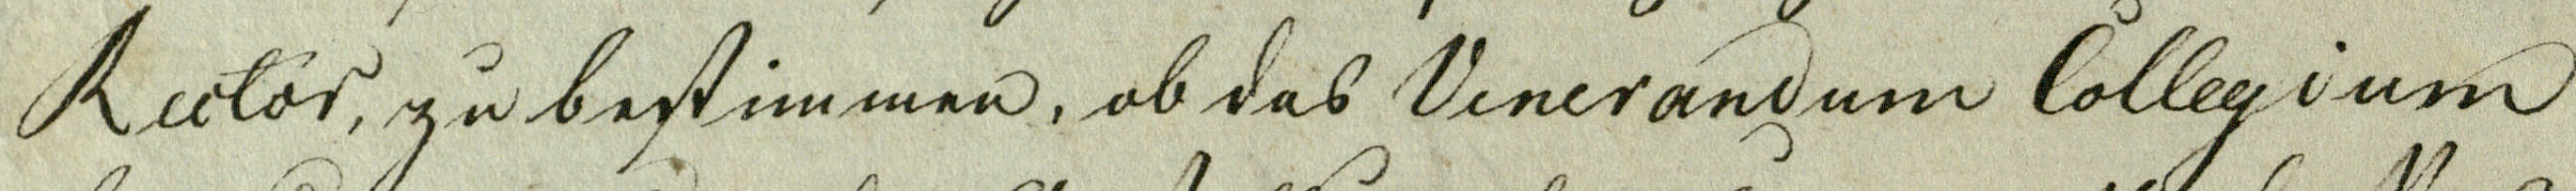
Rector, zu bestimmen, ob das Venerandum Collegium
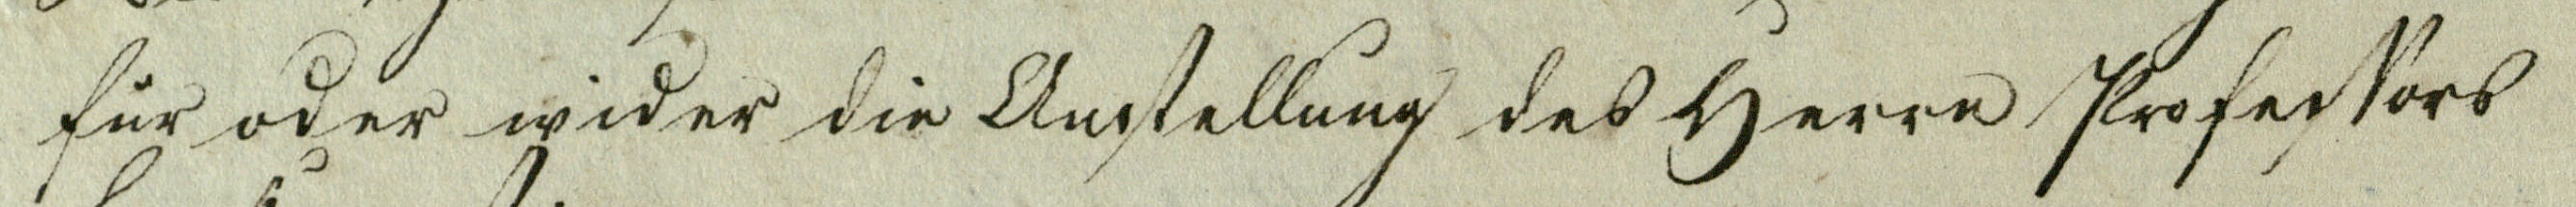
für oder wider die Anstellung des Herrn Professors
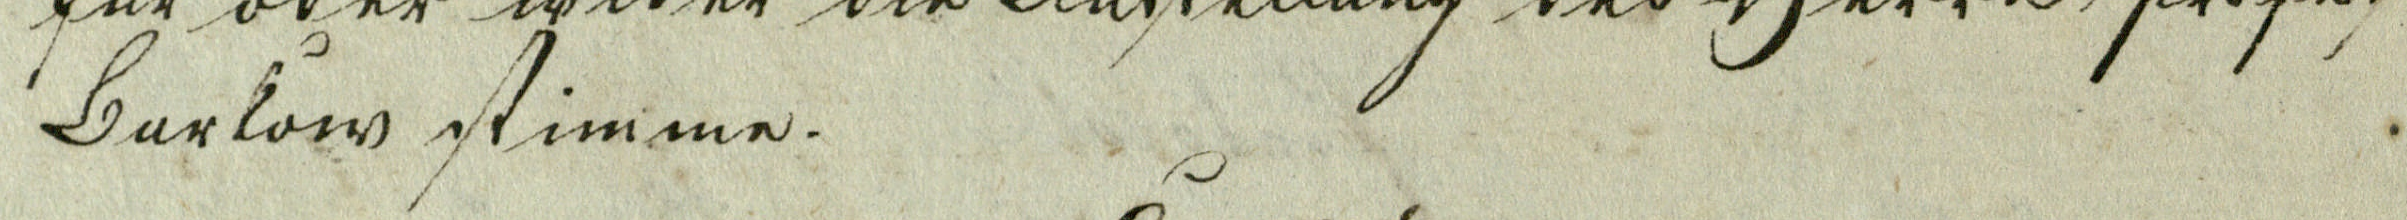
Barkow stimmen.
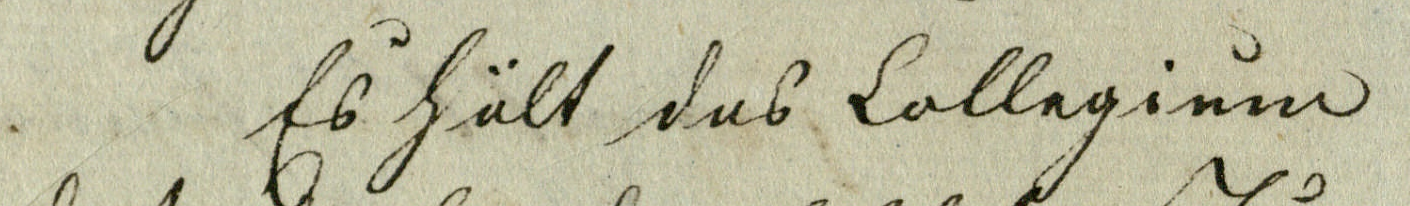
Es hält das Collegium
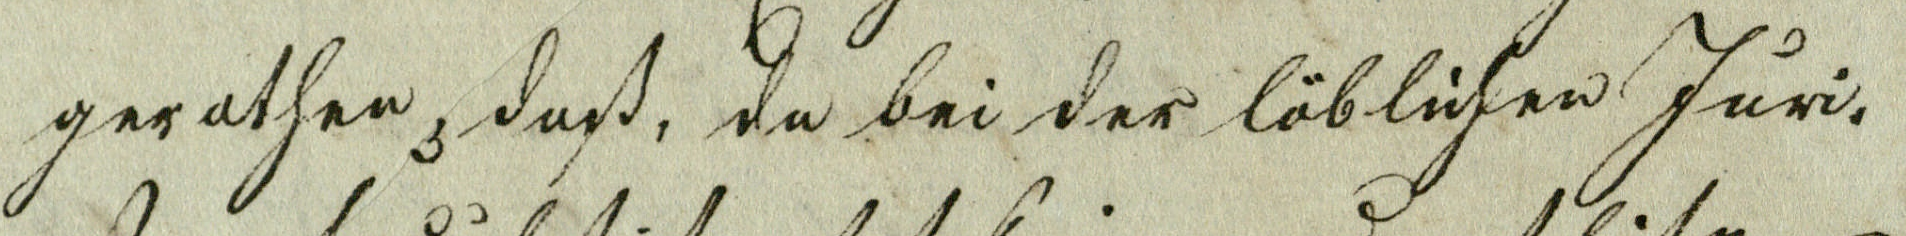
gerathen, daß, dabei der löblichen Juri¬
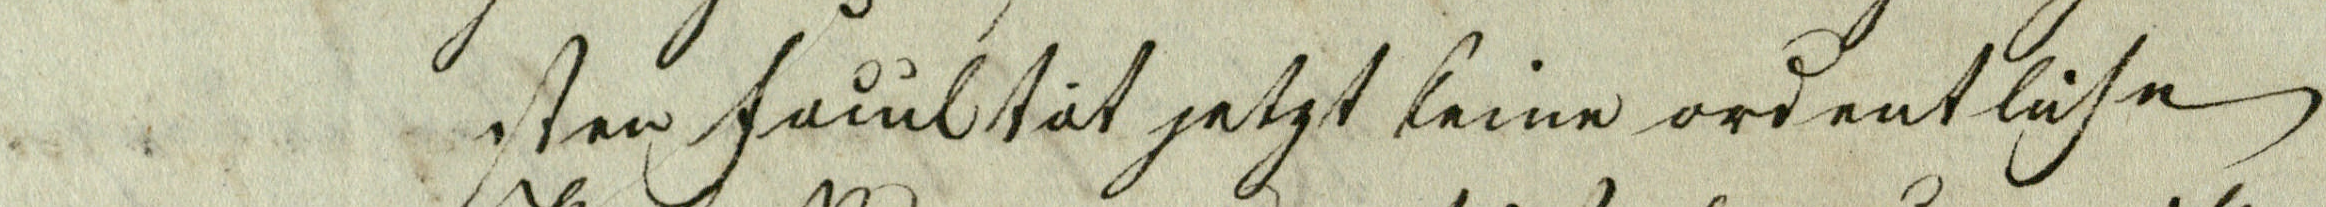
stischen Faultät jetzt keine ordentliche
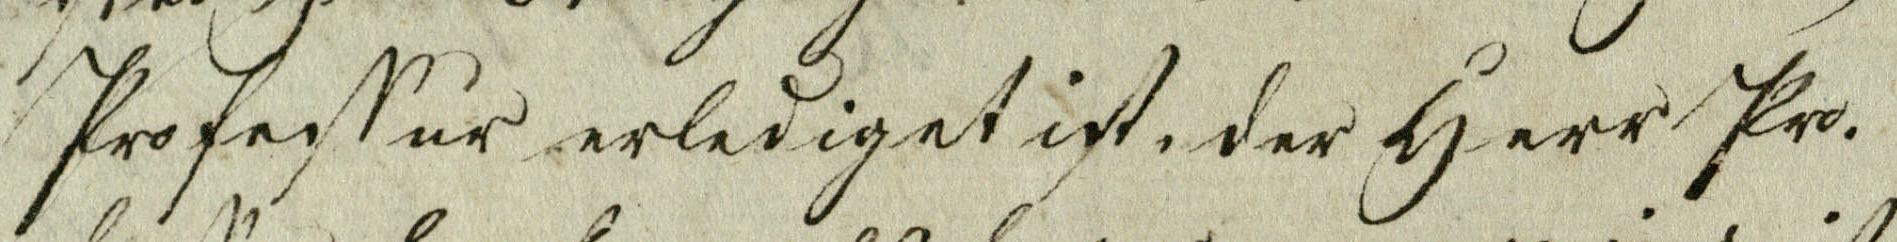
Professur erledigt ist, der Herr Pro¬
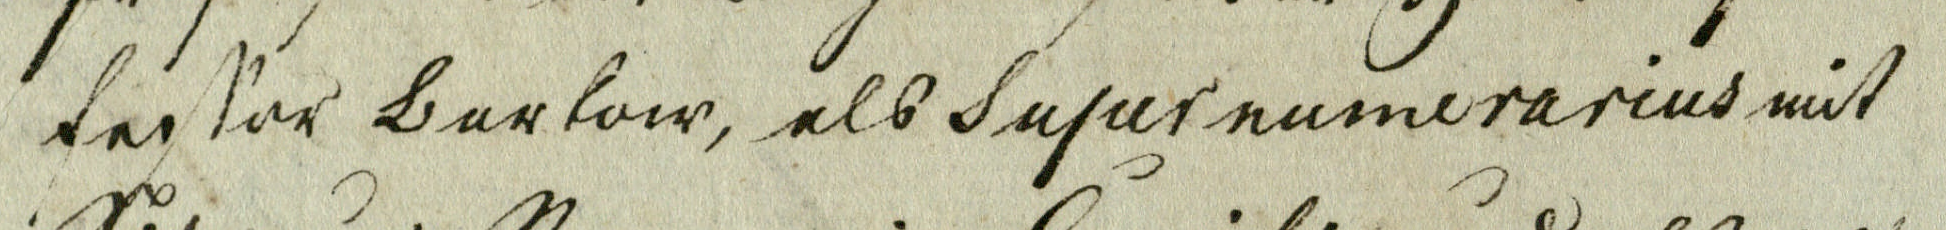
fessor Barkow, als Supernumerarius mit
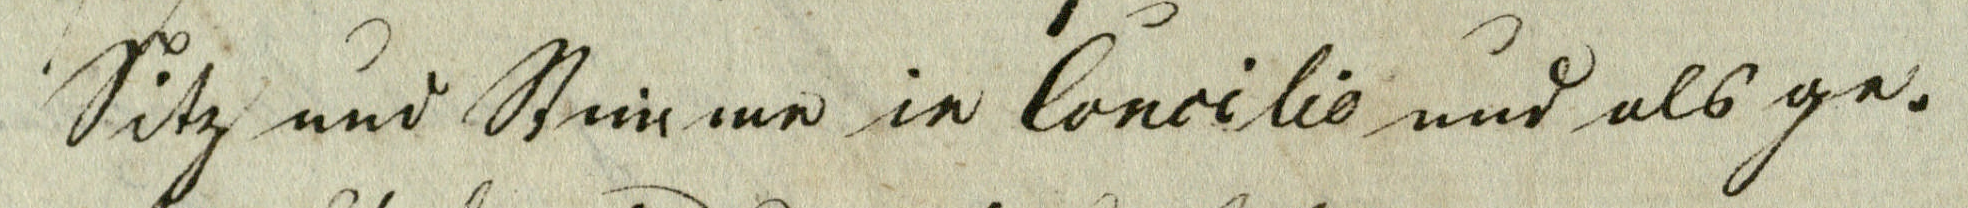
Sitz und Stimme in Concilio und als ge¬
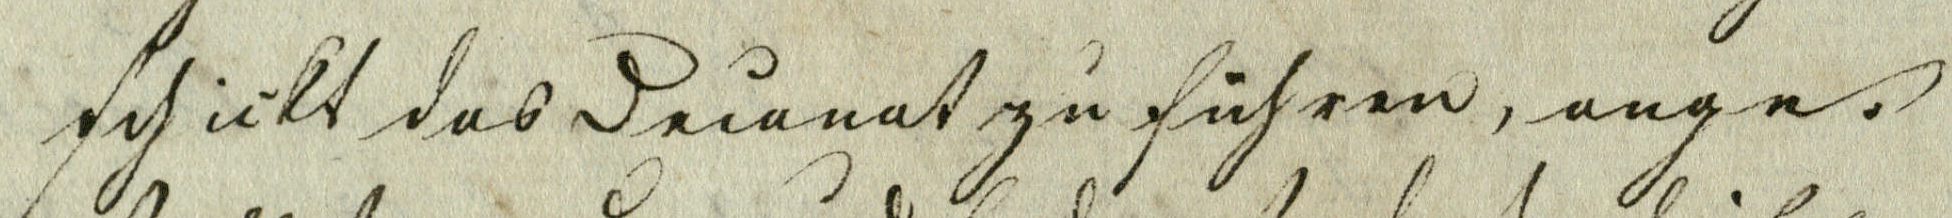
schickt das Decanat zu führen, ange¬
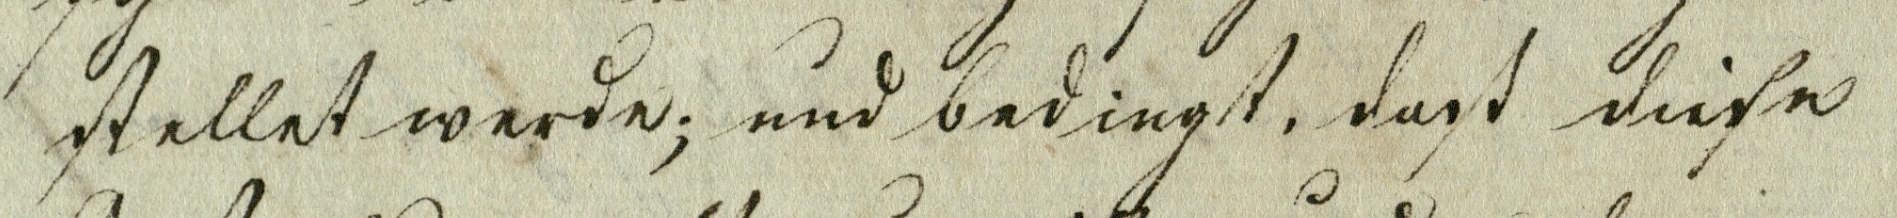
stellet werde; und bedingt, daß diese
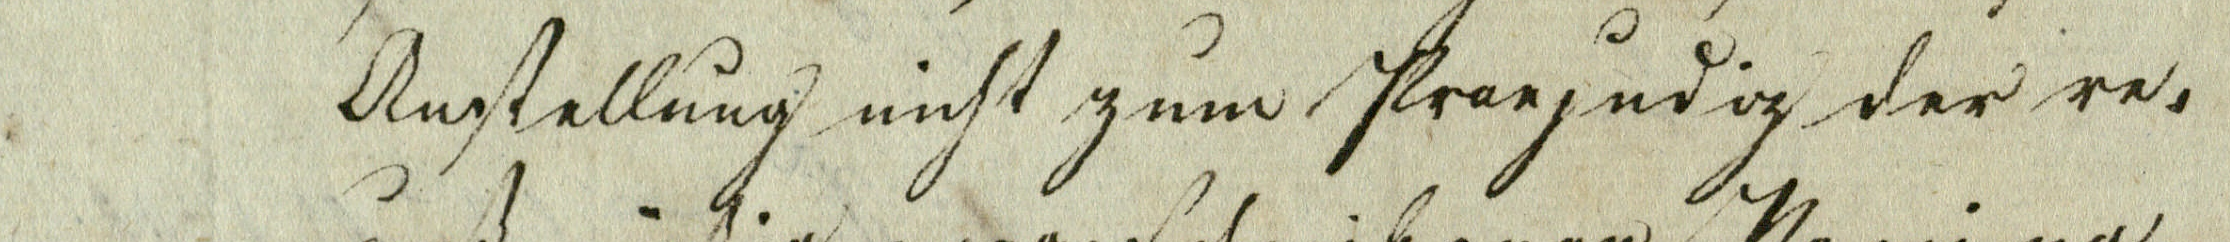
Anstellung nicht zum Praejudiz der re¬
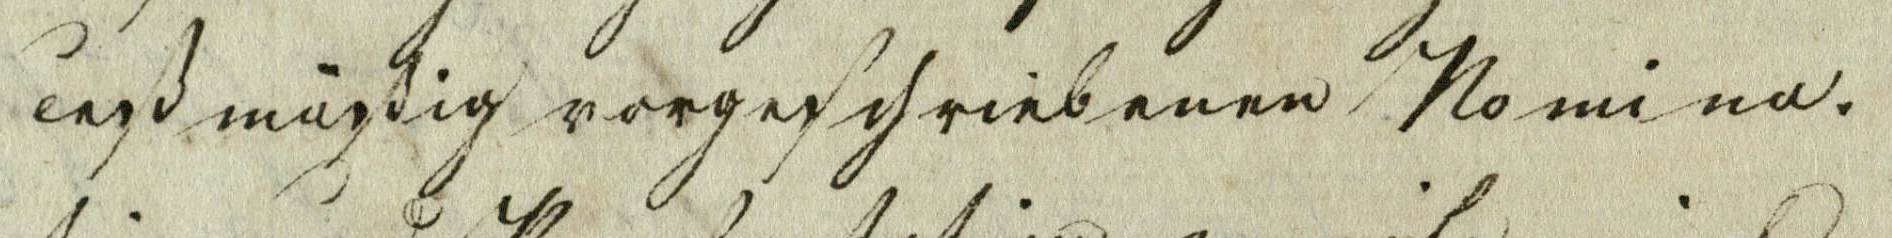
ceßmäßig vorgeschriebenen Nomina¬
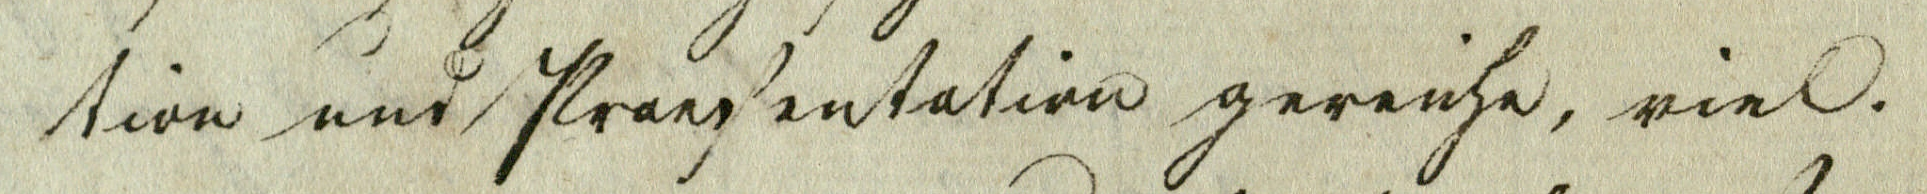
tion und Praesentation gereiche, viel¬
